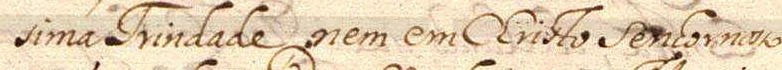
sima Trindade, nem em Christo senhor nosso
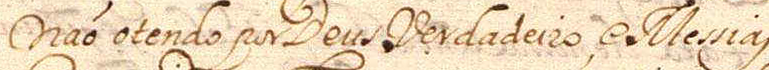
não o tendo por Deus Verdadeiro, e Messias
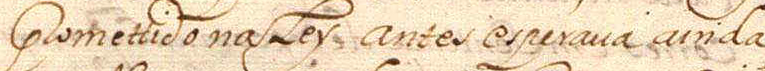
promettido na Ley antes esperaua ainda
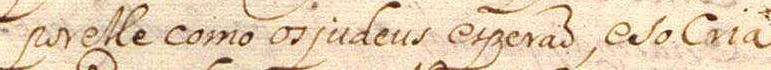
por elle como os judeus esperaõ, e so Cria
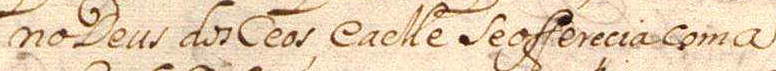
no Deus dos Ceos, e a elle se offereçia com a
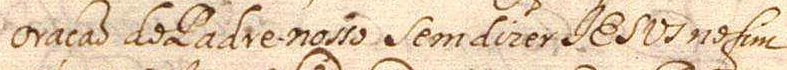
oraçaõ do Padre nosso sem dizer JESVs no fim
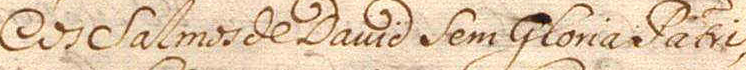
e os Salmos de Dauid Sem Gloria Patri,
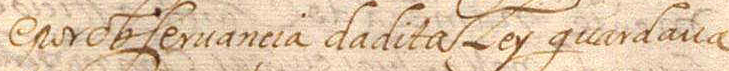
e por obseruançia da dita Ley guardaua
